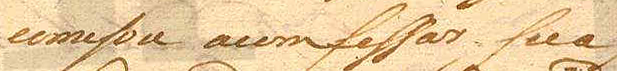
comesou a comfessar suas
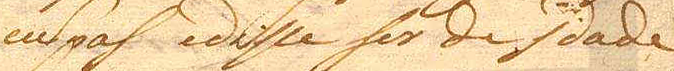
culpas e disse ser de jdade
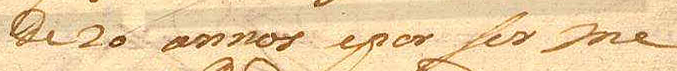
de 20 annos e por ser me
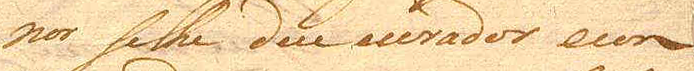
nor se lhe deu curador e con
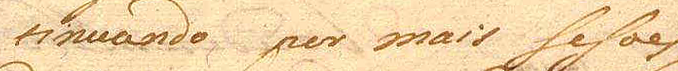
tinuando por mais sesoes
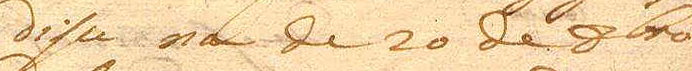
disse na de 20 de 8bro
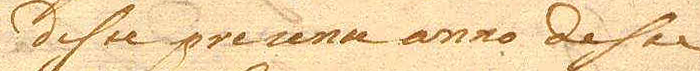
deste presente anno deste
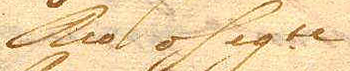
Reo o seg.te
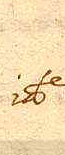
id̄e
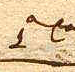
1a ta
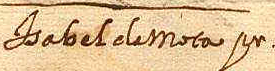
Isabel da mota pr.
